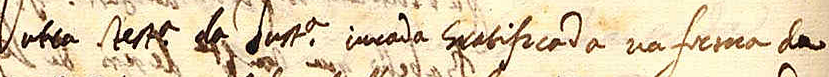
Outra test.a da Iust.a iurada E ratificada na forma de
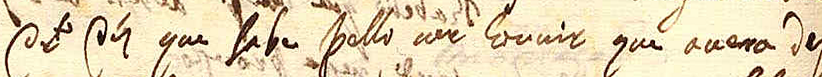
drto diz que sabe pello uer E ouuir que auera dez
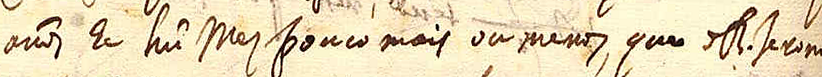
anōs Ee hū Mez pouco mais ou menos, que o R. Jeroni
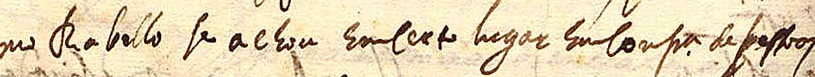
mo Rabello se achou Em Certo lugar En Conp.a de pessoas
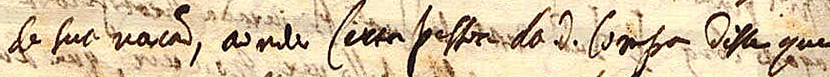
de sua nacaõ, aonde Certa pessoa da .d. Compa disse que
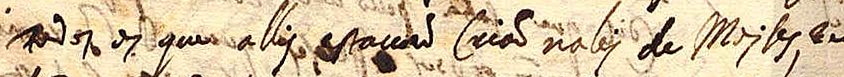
todos os que ally estauaõ Criaõ na lej de Mojses, Ee
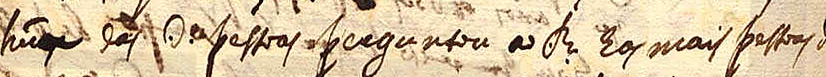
hūa das .d. pessoas perguntou ao R. E as mais pessoas da
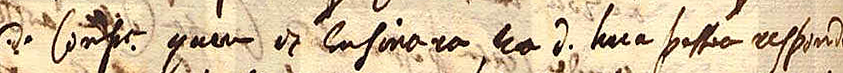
.d. Conpa. quem os Ensinara E a d. hua pessoa respondeo
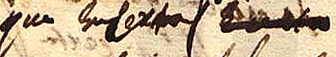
que En Certa p E certa
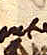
arte
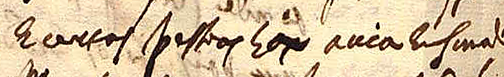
E certas pessoas E a auia Ensinado
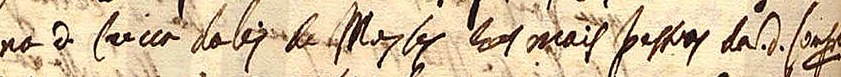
na d. Crecca da lej de Mojses E as mais pessoas da .d. Comꝑa
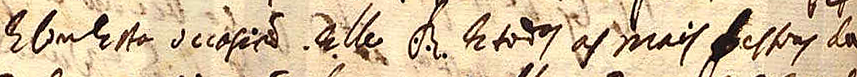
E Com Esta occasiaõ. Elle R. E todas as mais pessoas da
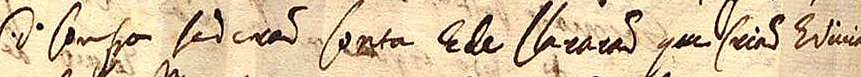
.d. Compa se deraõ Conta E deClararaõ que Criaõ E viuiaõ
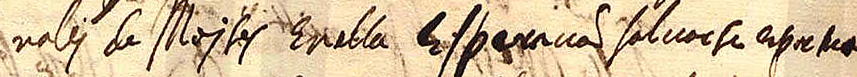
na lej de Mojses E nella Esperauaõ saluarse E por sua
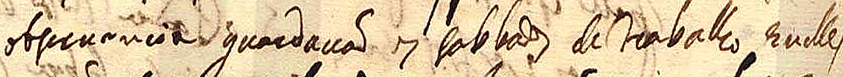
obseruancia guardauaõ os sabbados de trabalho E nelles
